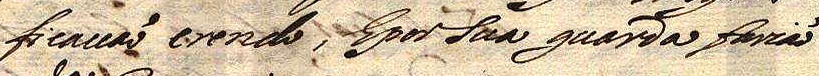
ficauaõ crendo, E por sua guarda fariaõ
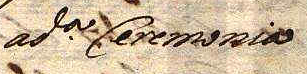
a d.a Ceremonia
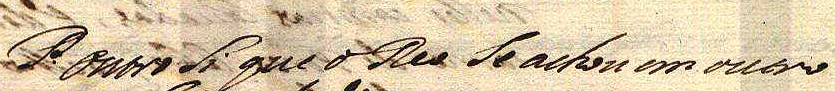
E outrosi que o Reo se achou em outro
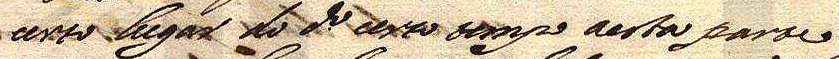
certo lugar do d.o certo tempo a esta parte
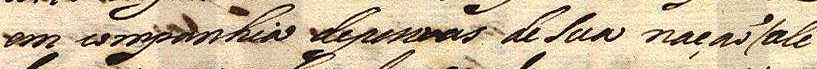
em companhia de pessoas de sua naçaõ / alē
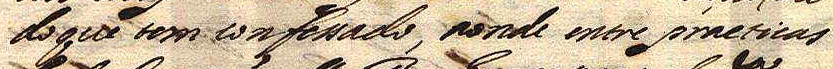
do que tem confessado, aonde entre practicas
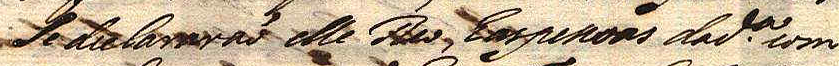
se declararaõ elle Reo, E as pessoas da d.a com
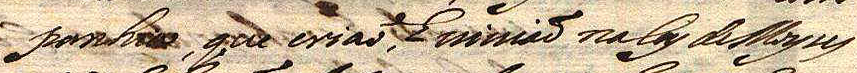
panhia, que criaõ, E uiuiaõ na ley de Moyzes
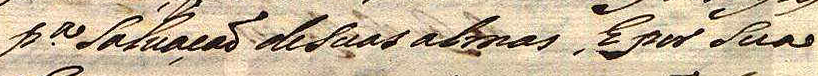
p.a saluaçaõ de suas almas, E por sua
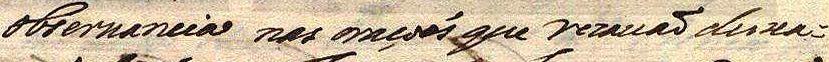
obseruancia nas oraçoẽs que rezauaõ deixa
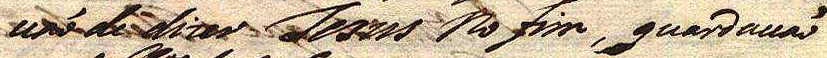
uaõ de dizer Iesus no fim, guardauaõ
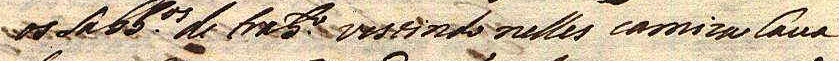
os sabb.os de trab.o vestindo nelles camiza laua
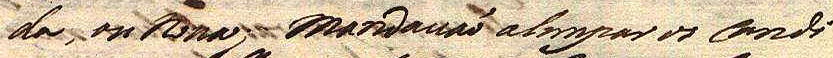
da, ou noua, mandauaõ a limpar os candi
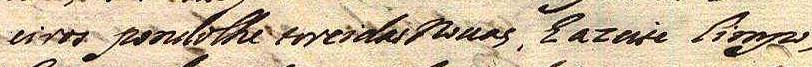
eiros pondolhe torcidas nouas, E azeite limpo,
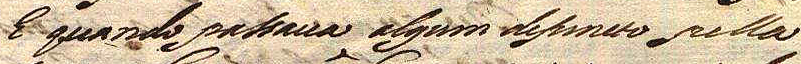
E quando passaua algum defuncto pella
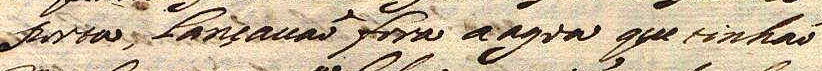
porta, Lançauaõ fora a agoa que tinhaõ
